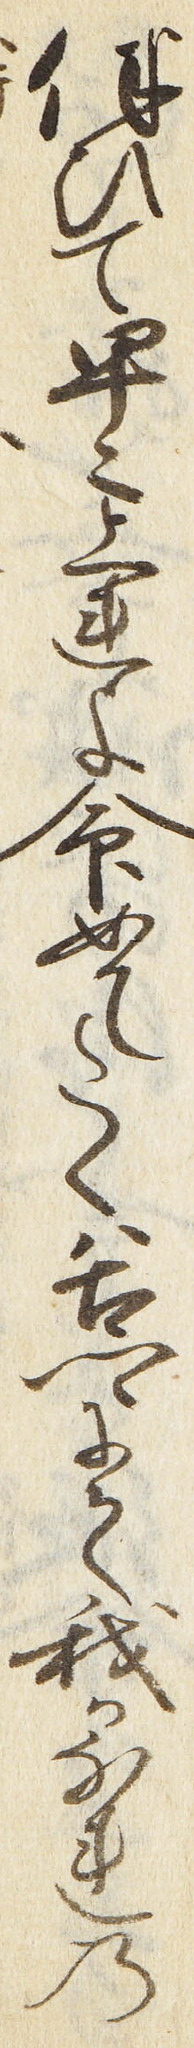伴ひて早々上れよ命めてたくは古郷にて我かなれの
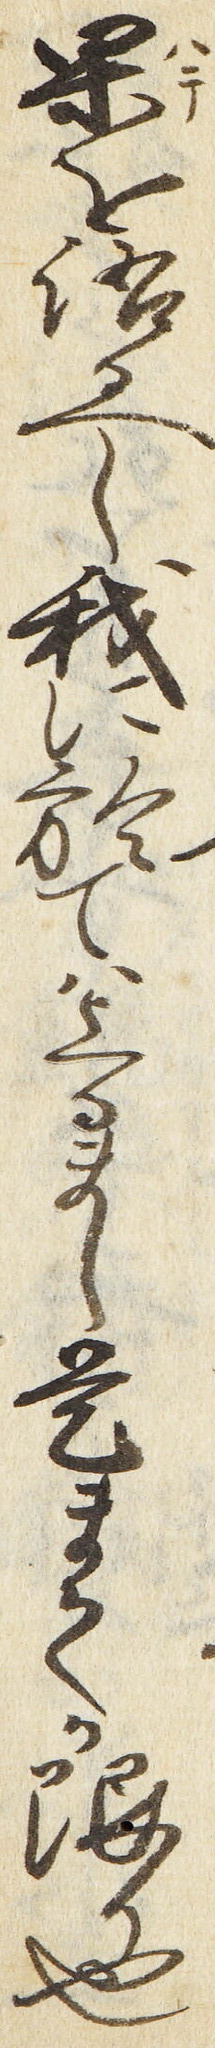果を語るへし我に於ては上るまし是まてか限り也

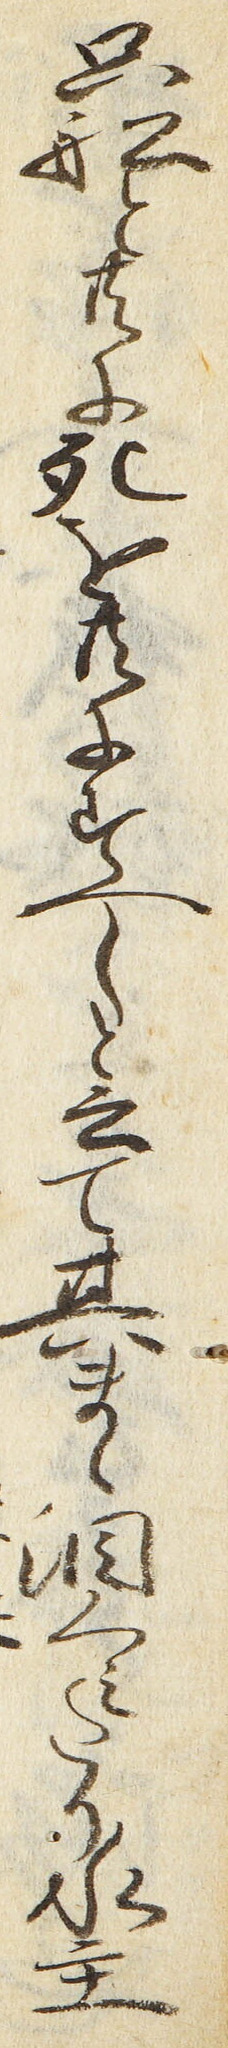只船と共に死を共にすへしと云て其まゝ泪くみたり水主
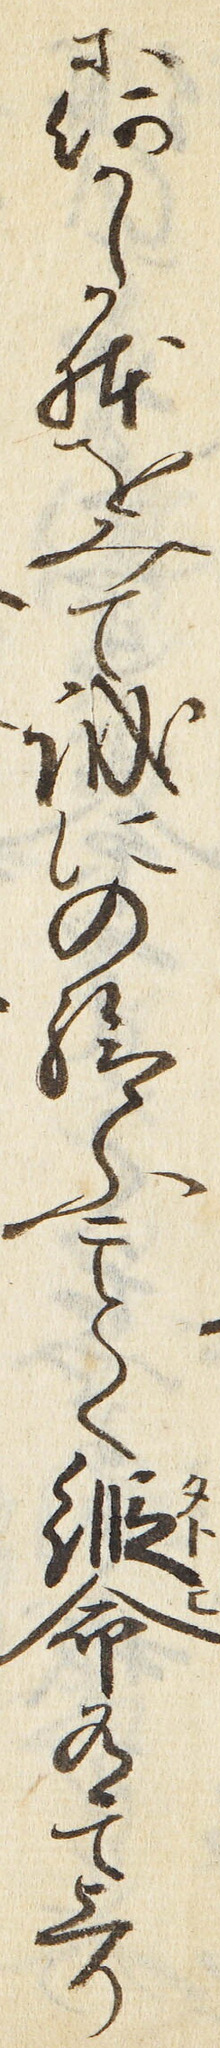等何かしか体をみて誠にの給ふことく縦命有て上り
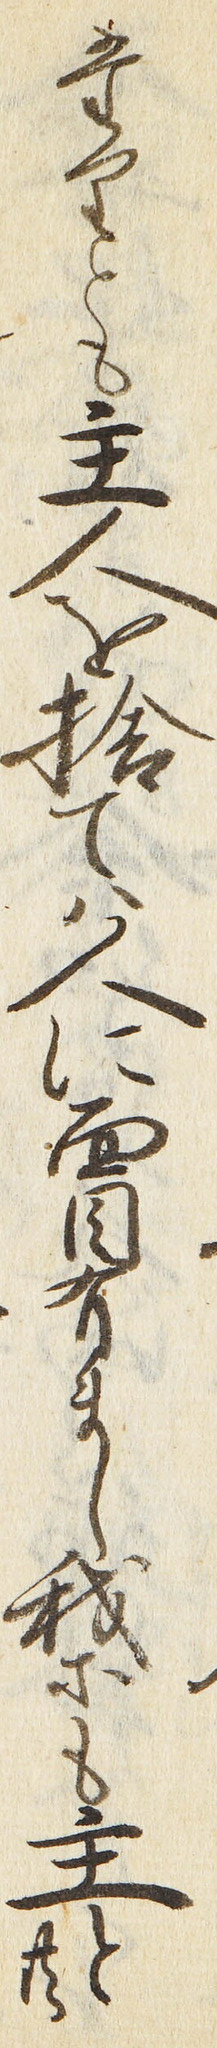たりとも主人を捨ては人に面目有まし我等も主と共
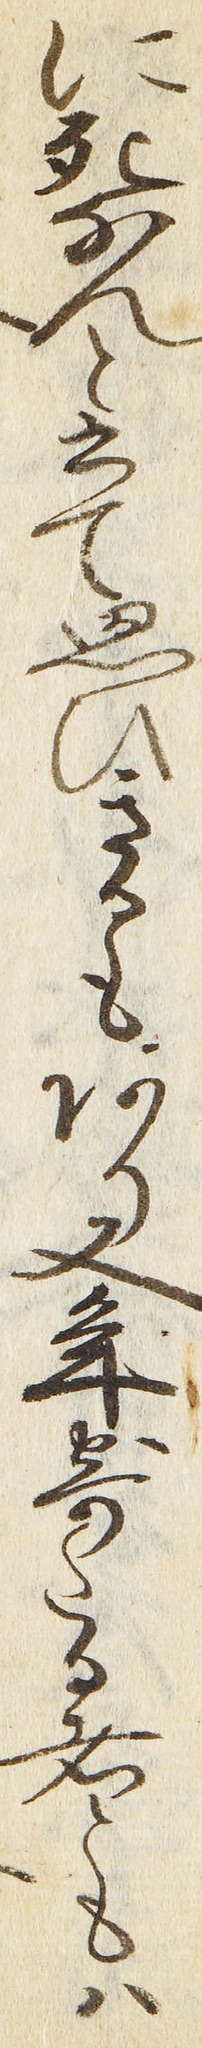に死なんと云て思ひきるもあり又年寄たる者ともは
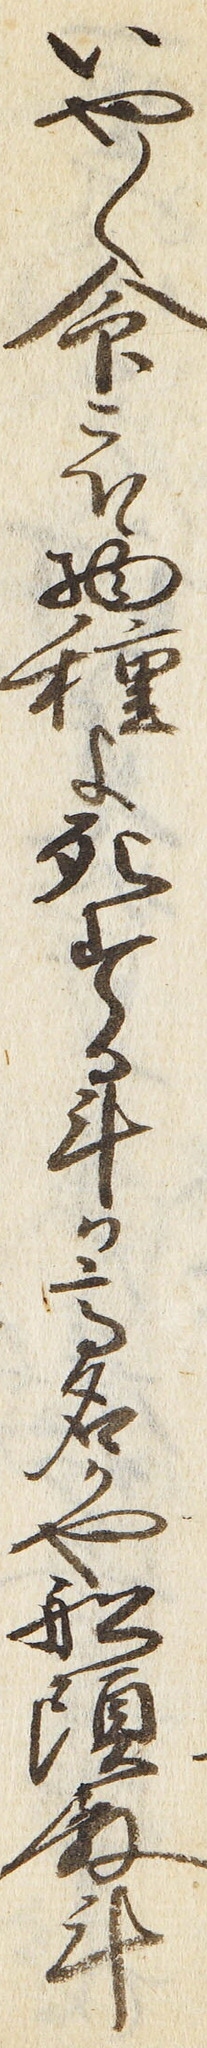いや〳〵命こそ物種よ死たる計か高名かや船頭殿計
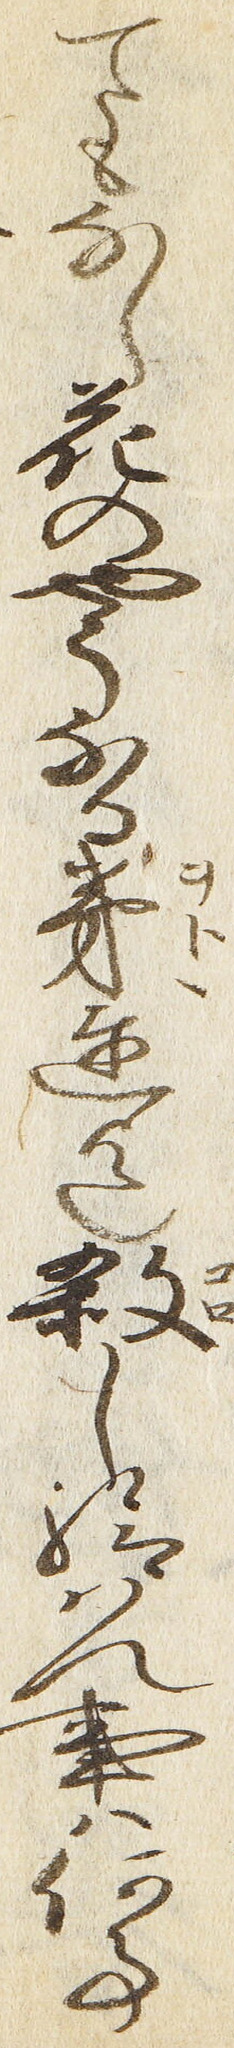てもなし花のやうなる弟達迄殺し給はん事は何事
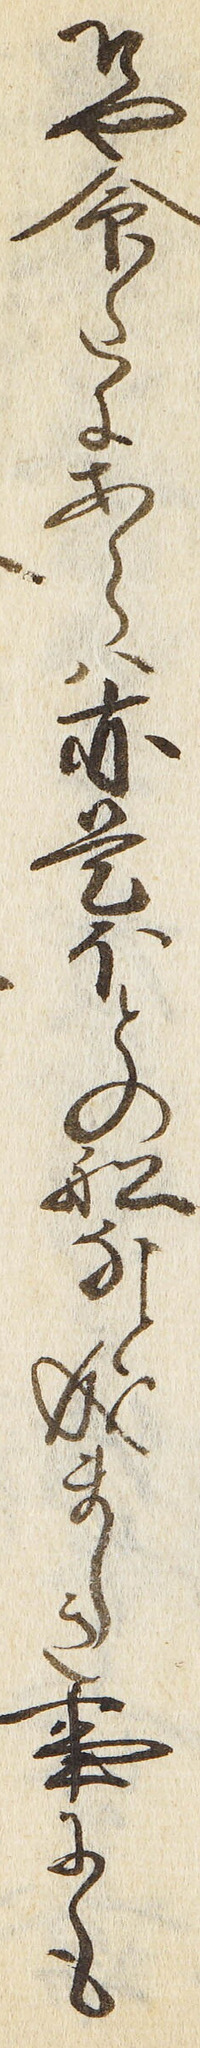そや命たにあらは亦是ほとの船なと成ましき事にも
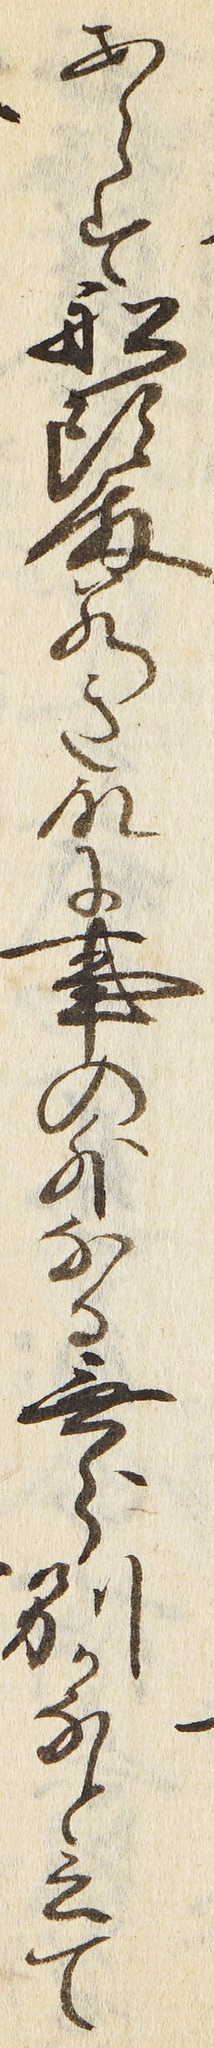あらす船頭殿若き故に事の外なる無分別かなと云て
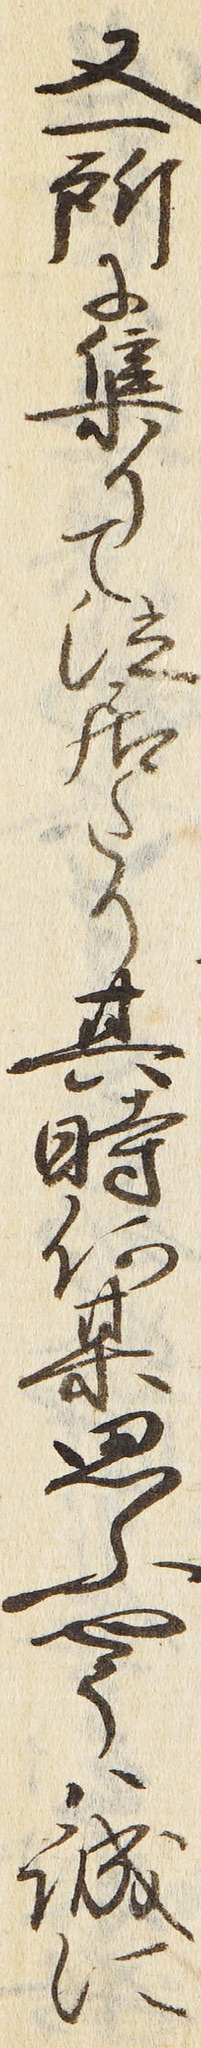又一所に集りて泣居たり其時何某思ふやうは誠に
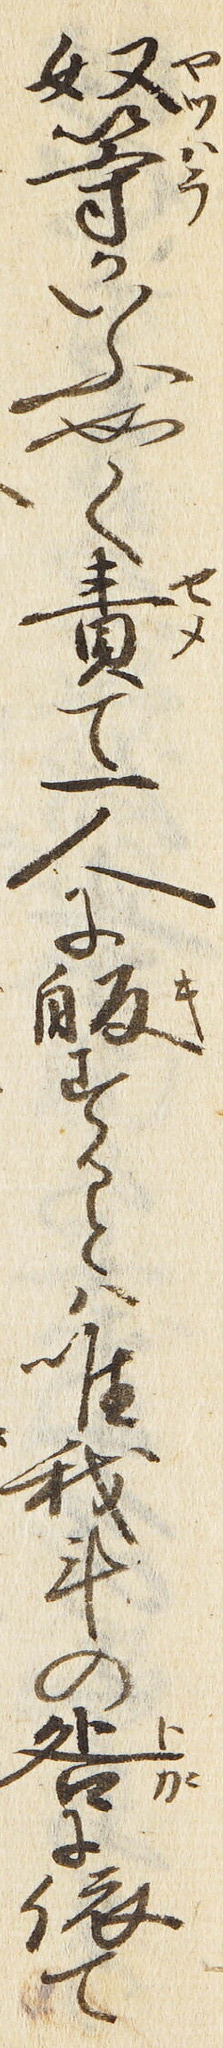奴等かいふ如く責て一人に皈するとは唯我計の咎に依て
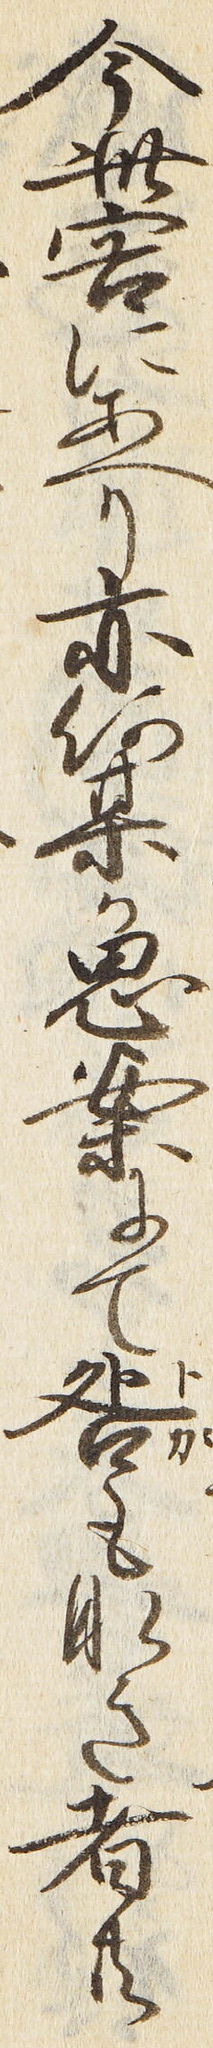今此害にあへり亦何某か思案にて咎もなき者共
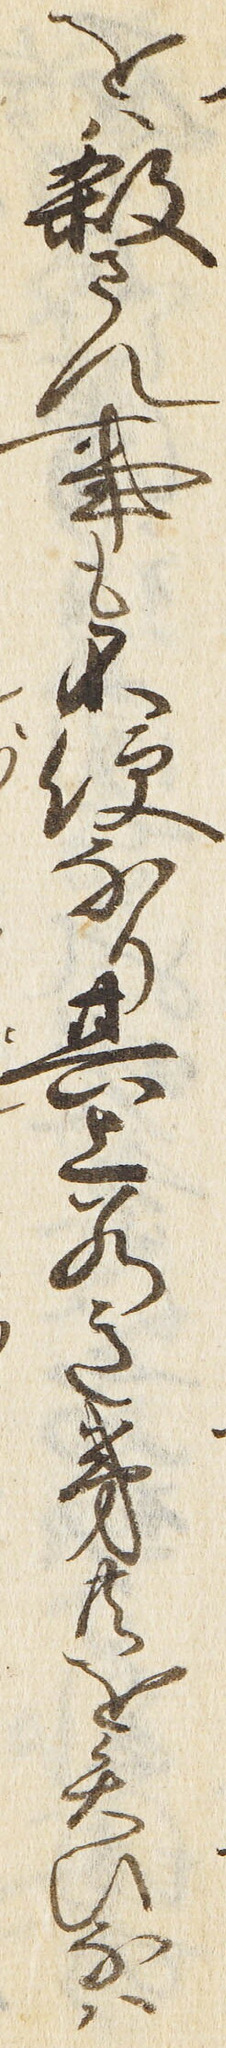をは殺さん事も不便なり其上若き弟共を失ひなは
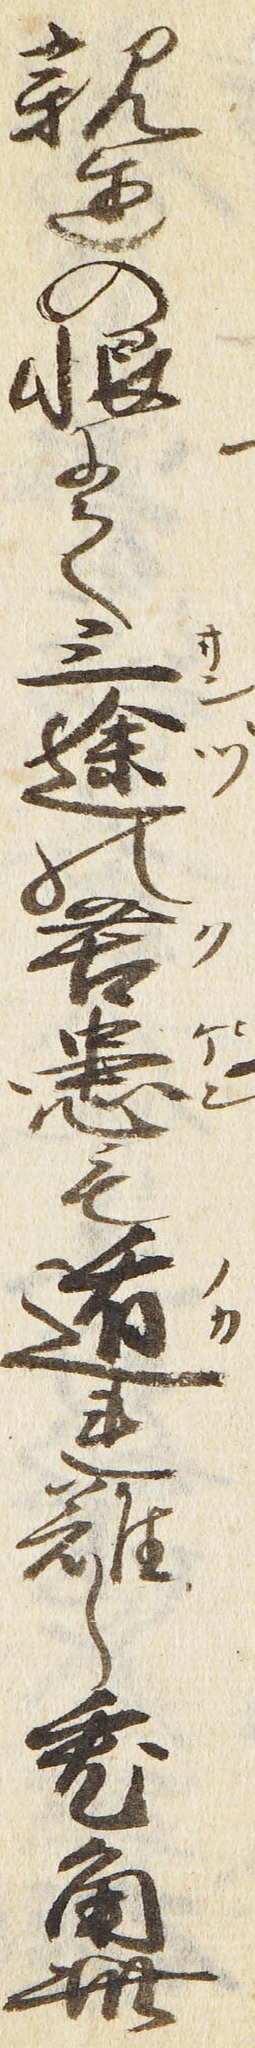親達の恨にて三途の苦患も遁れ難し兎角此
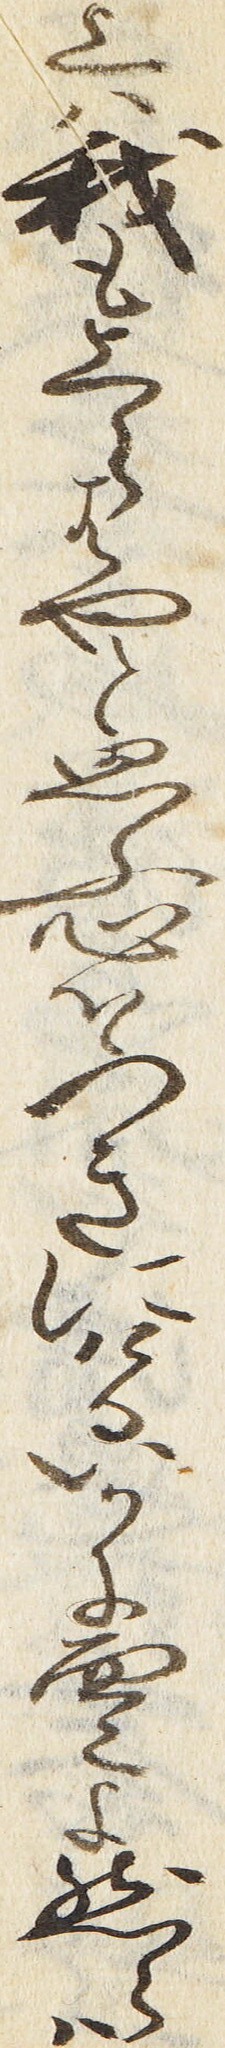上は我も上らはやと思ふ心そつきにけるいかに面々よ然らは
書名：海陸世話日記
